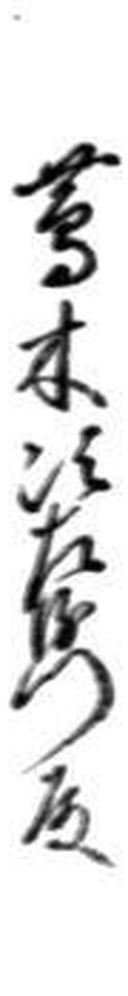蔦木次左衛門殿
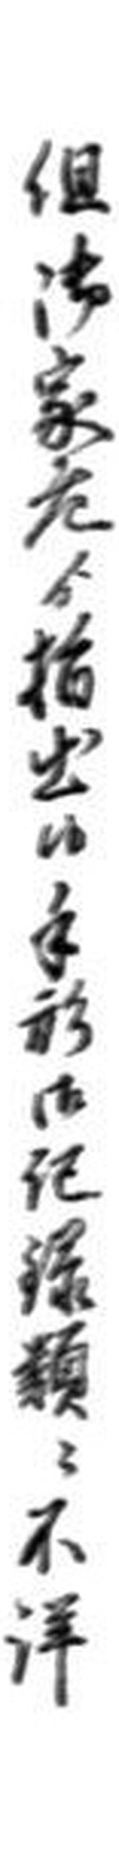但御家老ゟ指出候手形御記録類ニ不詳
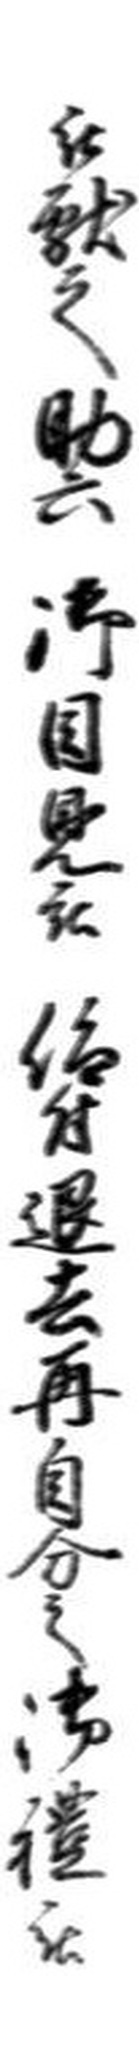被献之助六御目見被仰付退去再自分之御礼被

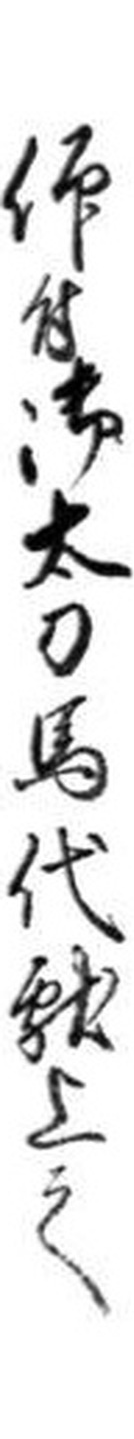仰付御太刀馬代献上之
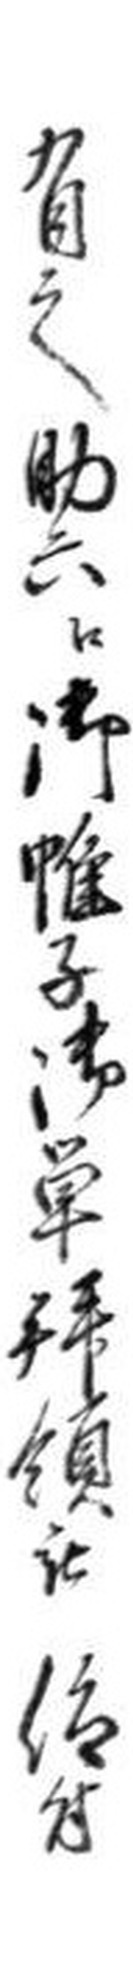有之助六江御帷子御単拝領被仰付
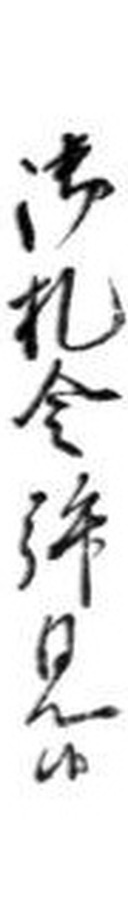御札令拝見候
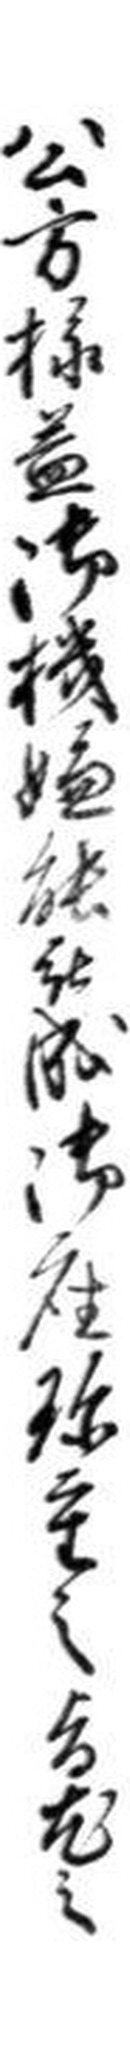公方様益御機嫌能被成御座珍重之旨尤之
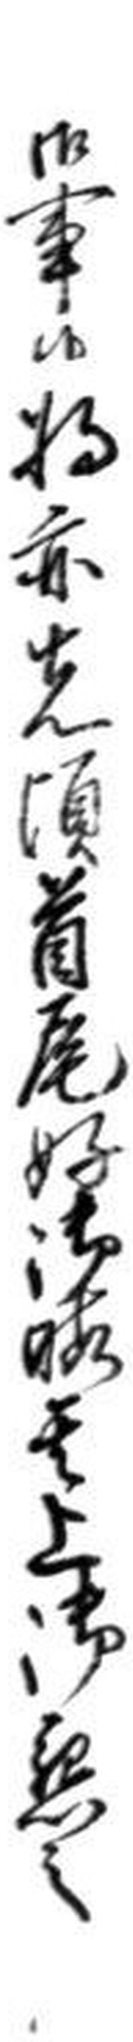御事候将又先頃首尾好御暇其上御懇之
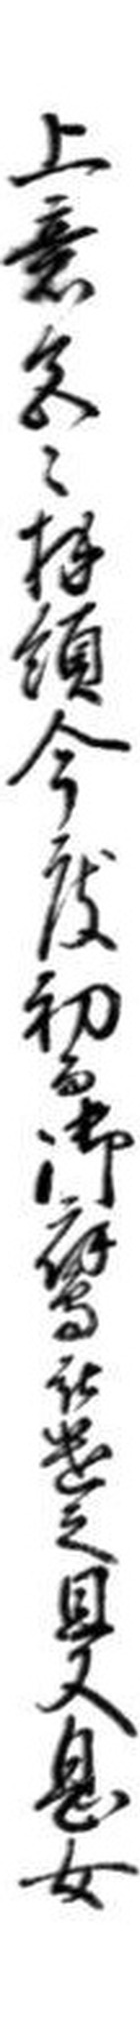上意色々拝領今度初而御鷹被遣之且又息女
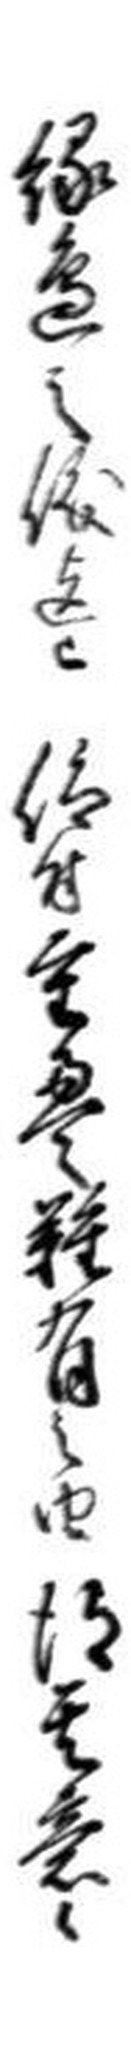縁辺之儀迄被仰付重畳難有之由得其意候
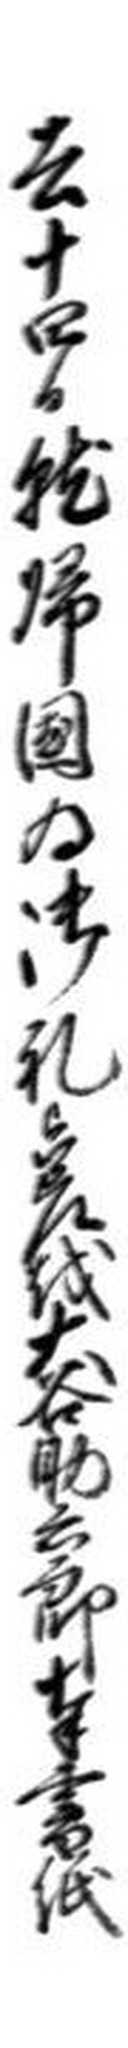去十四日就帰国為御礼被差越大谷助六郎奉書紙
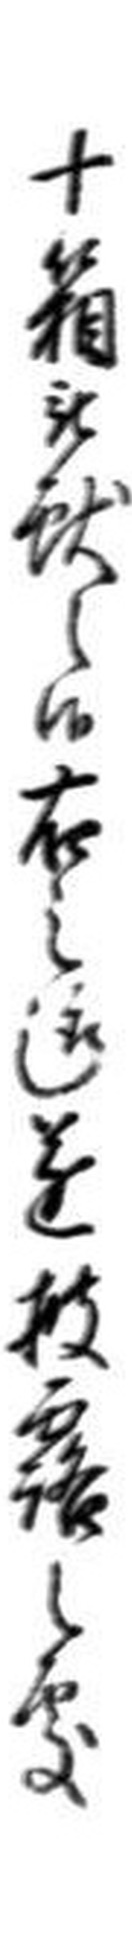十箱被献之候右之趣遂披露候処
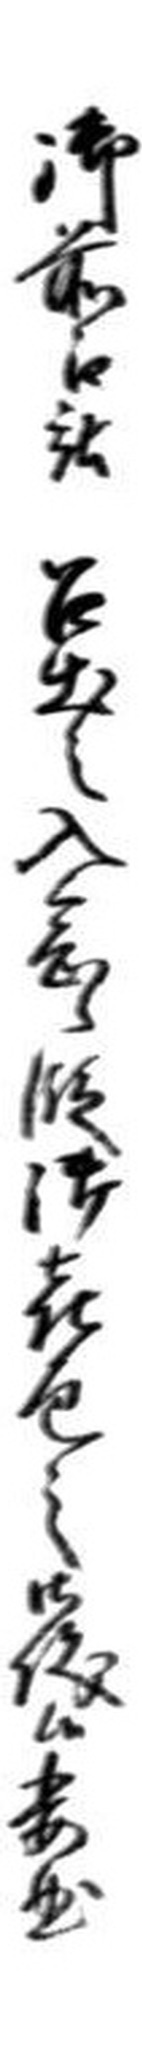御前江被召出之入念候段御喜色之御儀候委曲
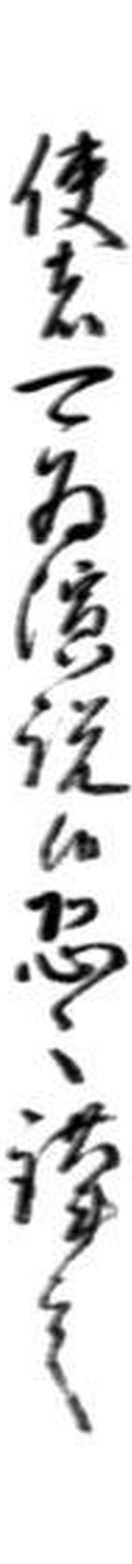使者可為演説候恐々謹言
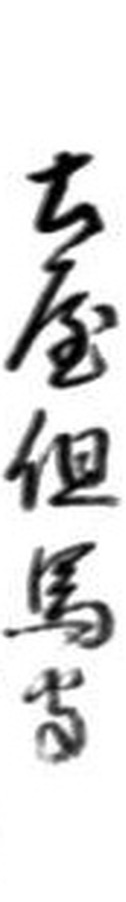土屋但馬守
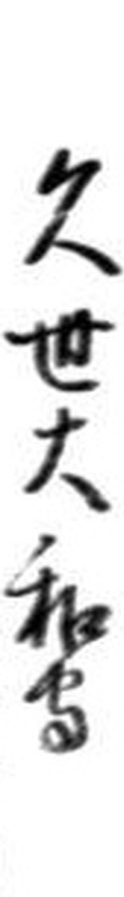久世大和守
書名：家譜 七 光通公 従寛文四年到同九年
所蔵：福井県文書館 Fukui Prefectural Archives
